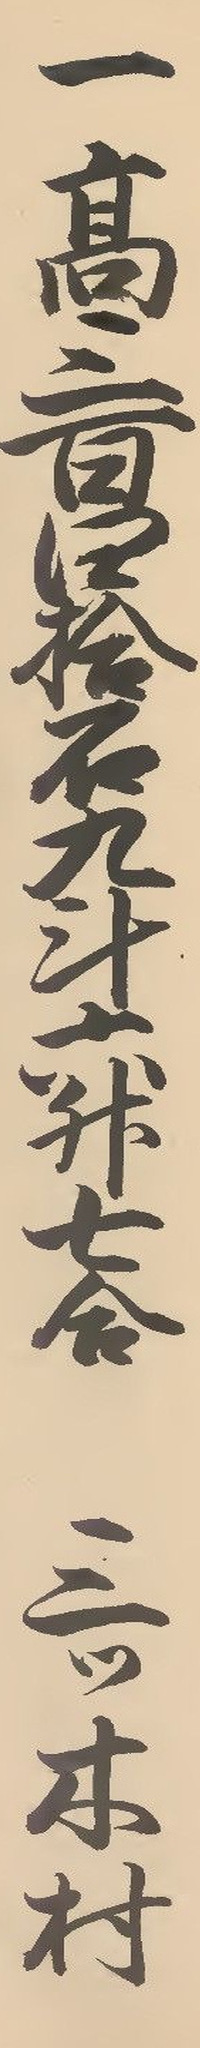一高三百四拾石九斗六升七合三ッ木村
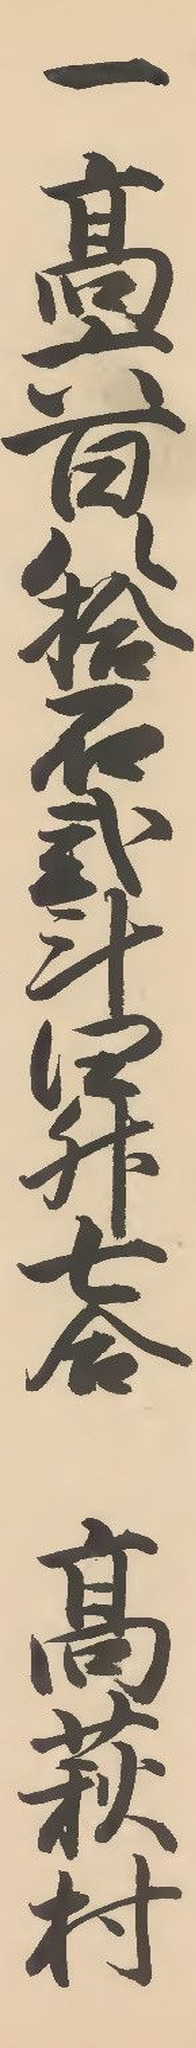一高六百八拾石弐斗四升七合高萩村
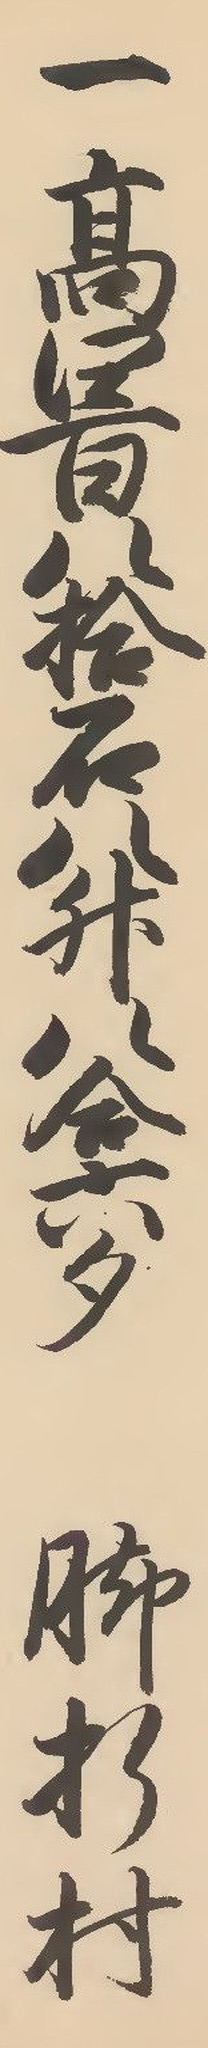一高四百八拾石八升八合六勺脚折村
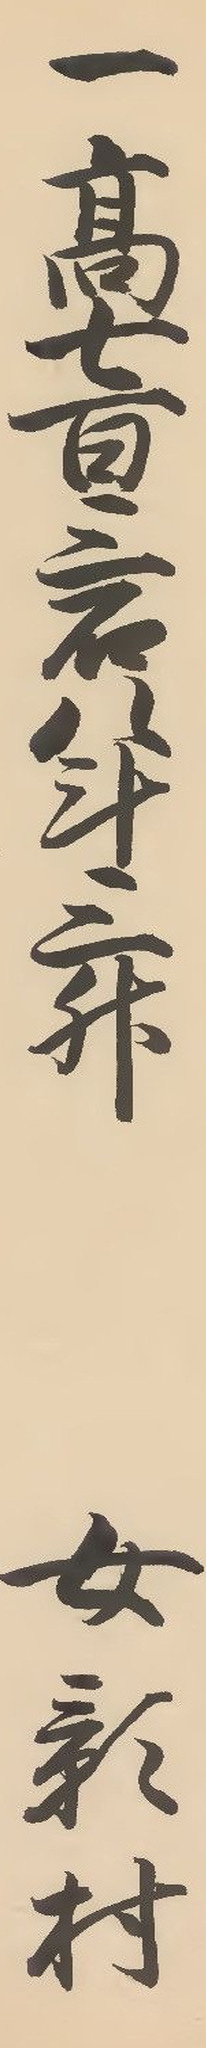一高七百三石八斗三升女影村
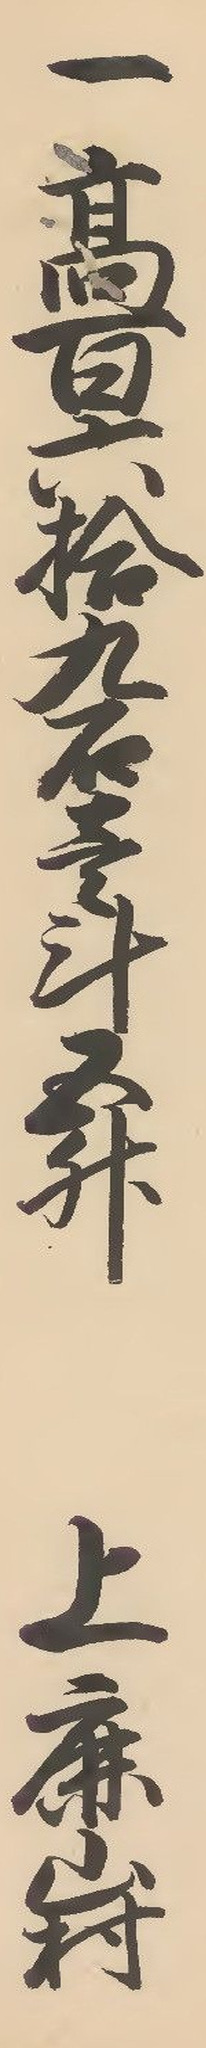一高百六拾九石壱斗五升上鹿山村

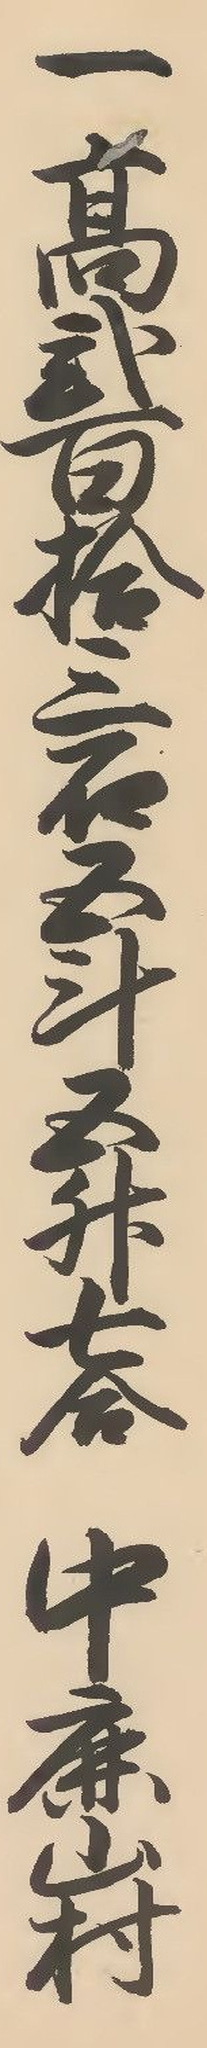一高弐百拾三石五斗五升七合中鹿山村
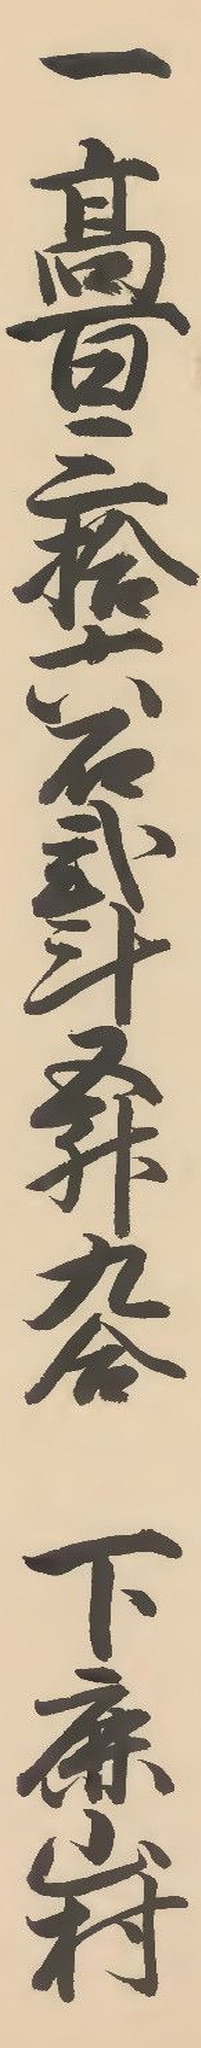一高百三拾六石弐斗五升九合下鹿山村
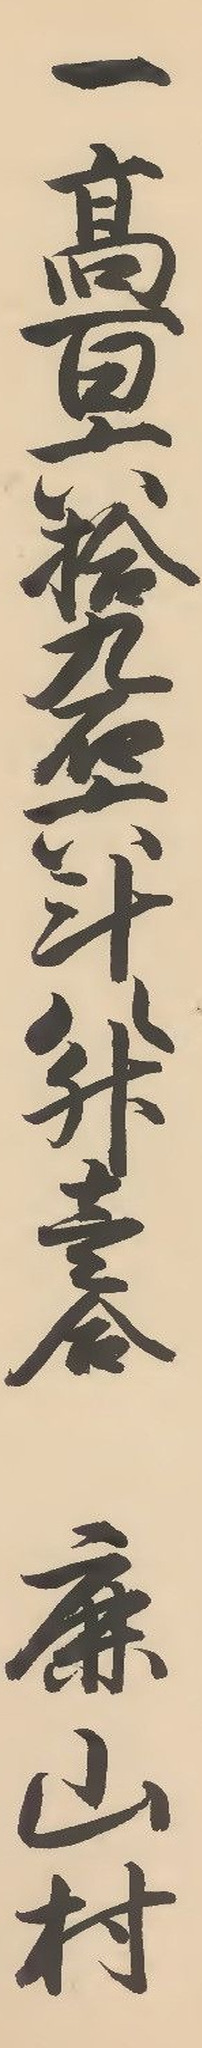一高百六拾九石六斗升八壱合鹿山村
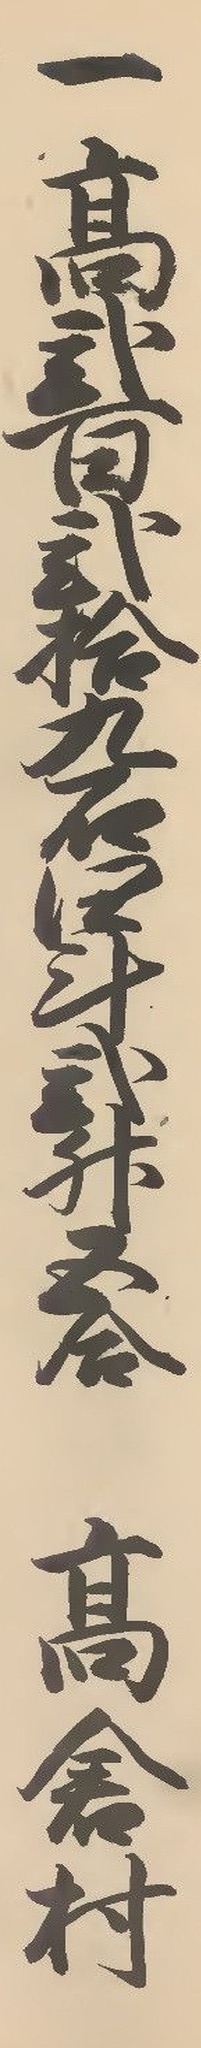一高弐百弐拾九石四斗弐升五合高倉村
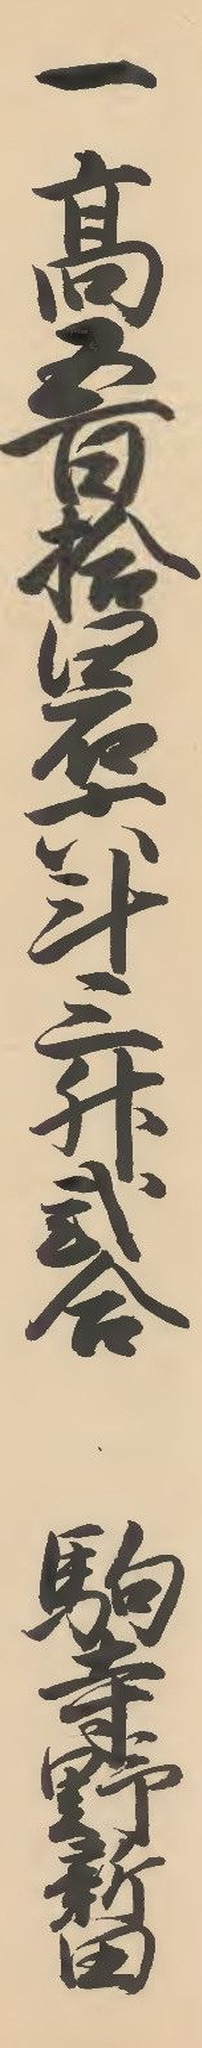一高五百拾四石六斗三升弐合駒寺野新田
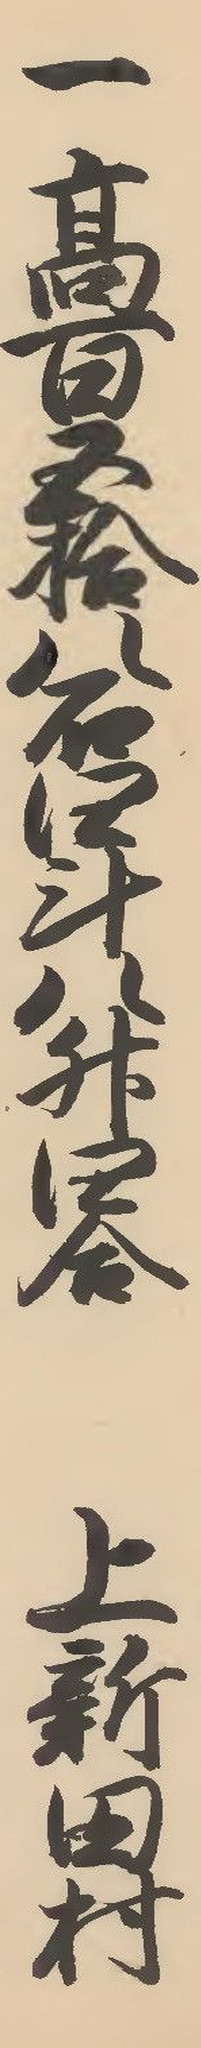一高百五拾八石四斗八升四合上新田村
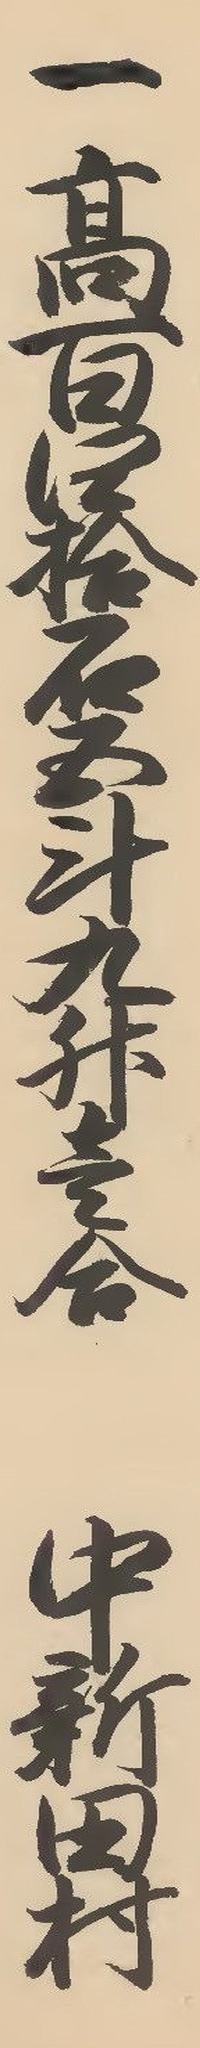一高百四拾石五斗九升壱合中新田村
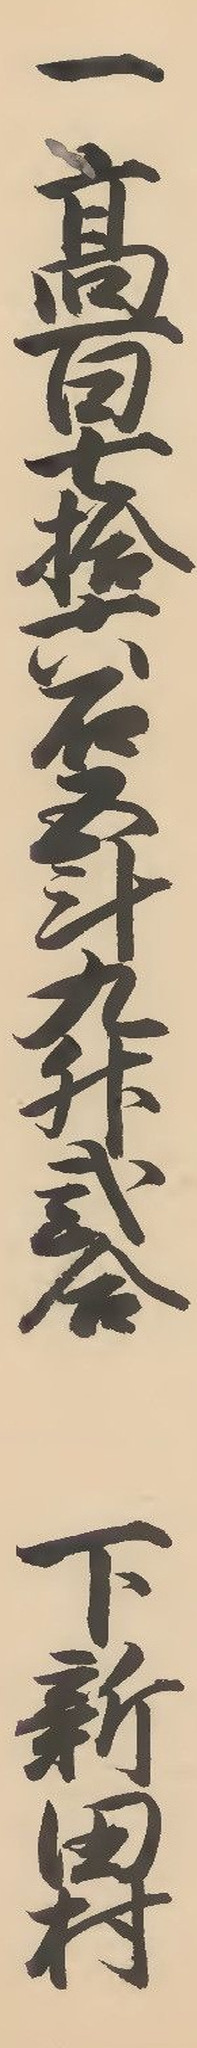一高百七拾六石五斗九升弐合下新田村

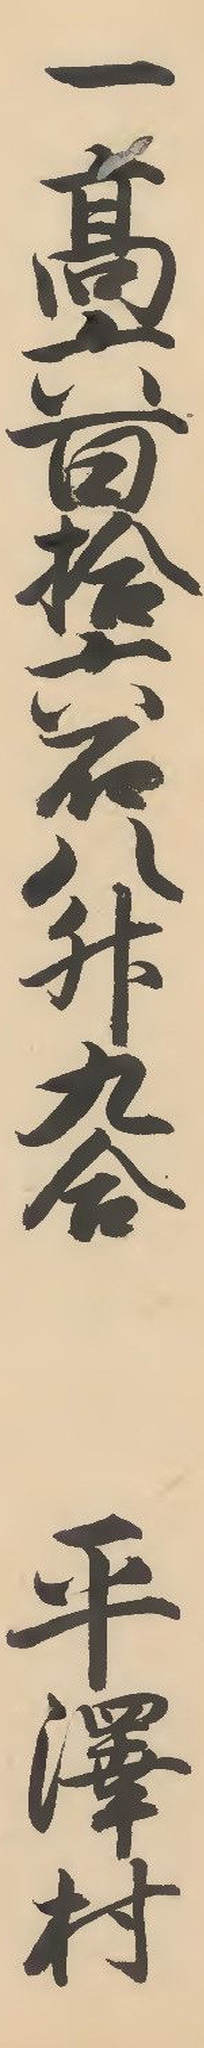一高六百拾六石八升九合平澤村
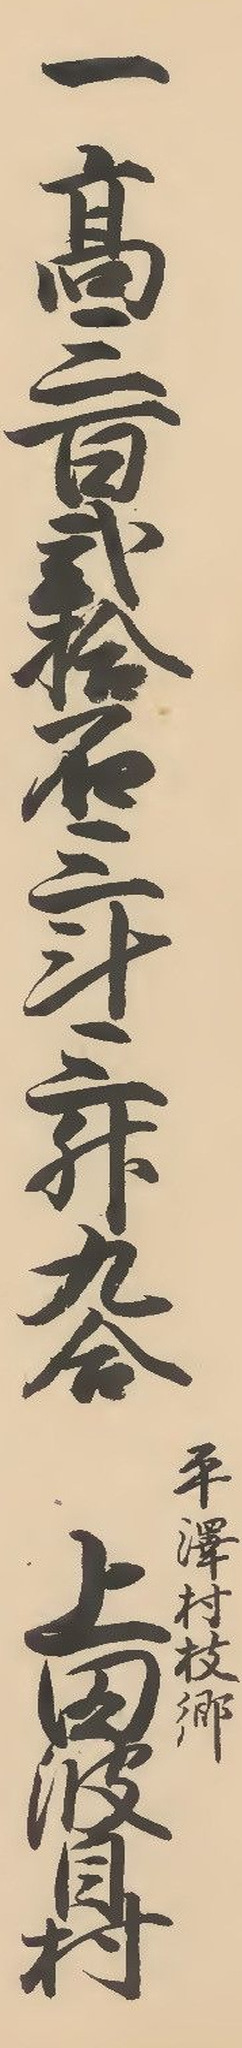一高三百弐拾石三斗三升九合上田波目村
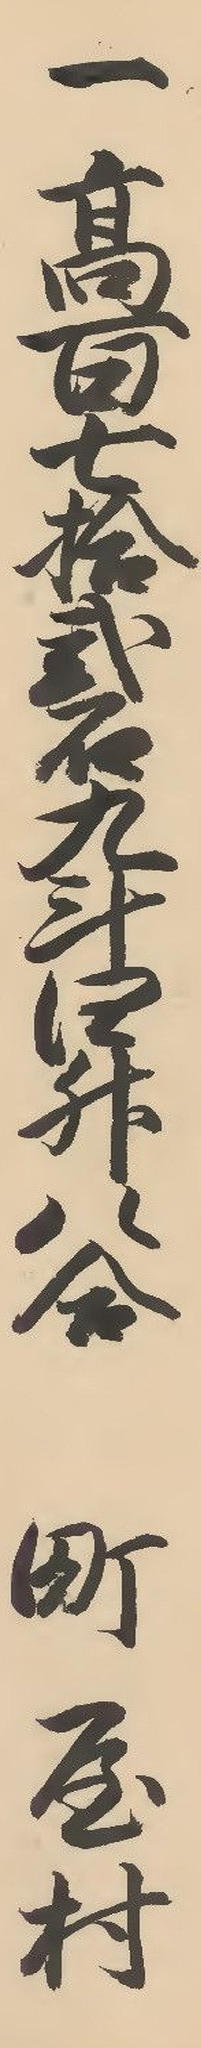一高百七拾弐石九斗四升八合町屋村
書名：武蔵国郷帳　上
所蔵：国立公文書館 National Archives of Japan
